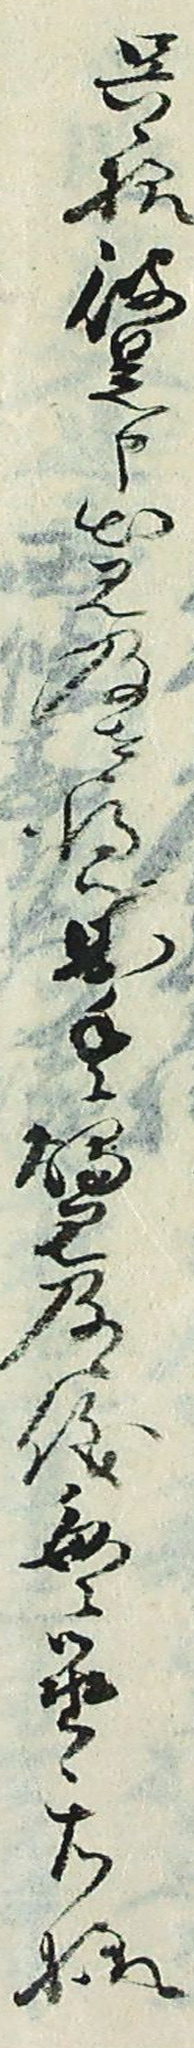呉候様彼是申出見及せ候得ハ即手ニ觸見及候儀毎々御坐候右様
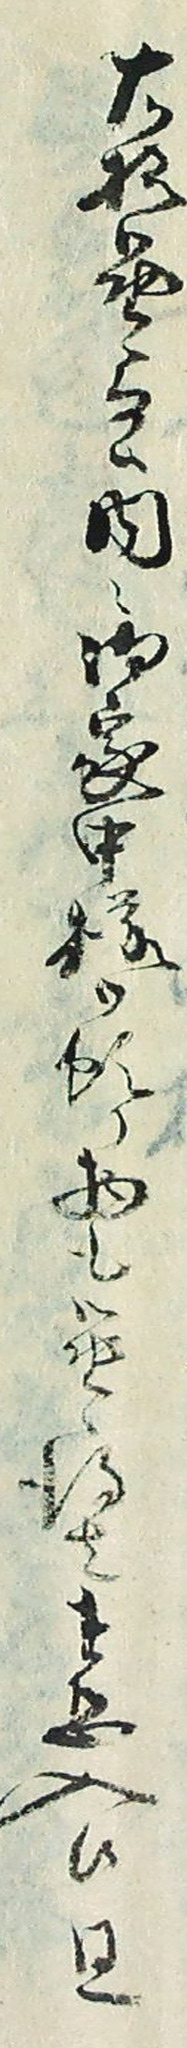右様御坐候而ハ内々御家中様御預り物も御坐候得者奉恐入候且
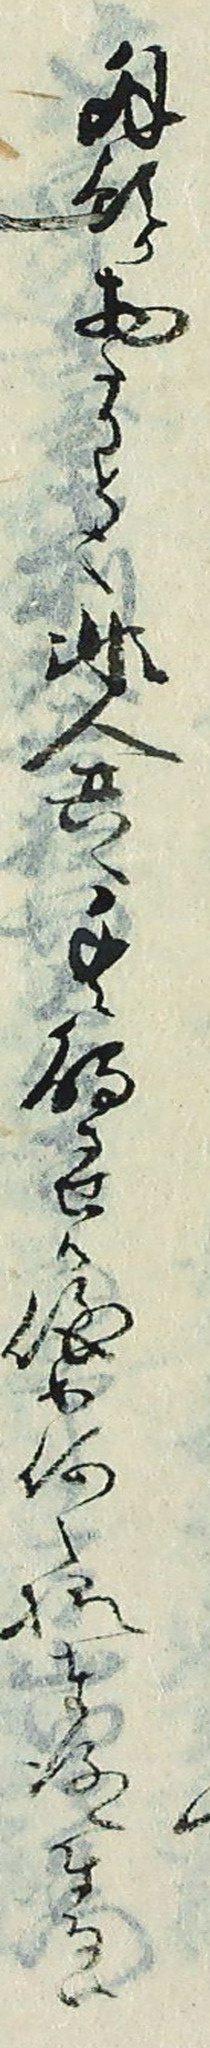外預り物たりとも非人共へ手ニ觸させ候儀如何之様奉存候付而ハ
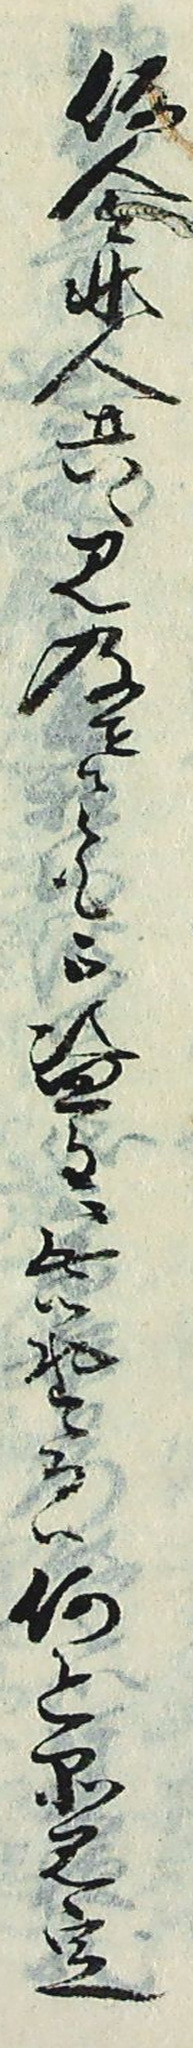仮令非人共へ見及せ候とも被盗主ニ無御坐候而ハ何れ品見定
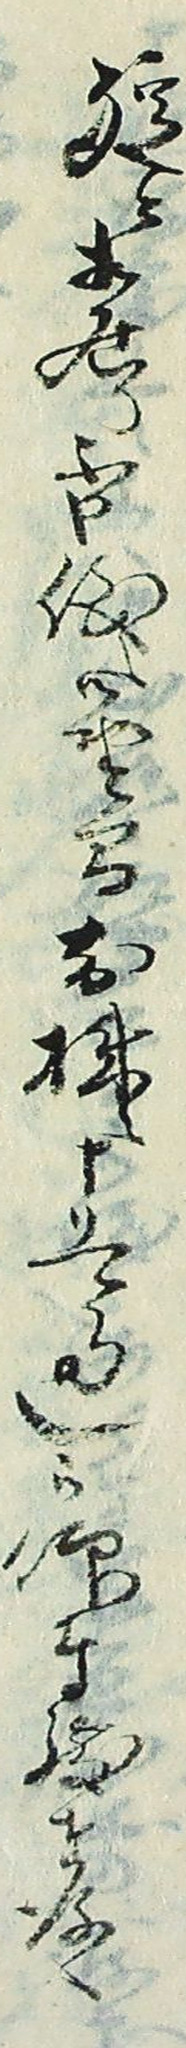聢と相居り不申儀ニ御坐候間前株も申上候通被仰付度奉存候
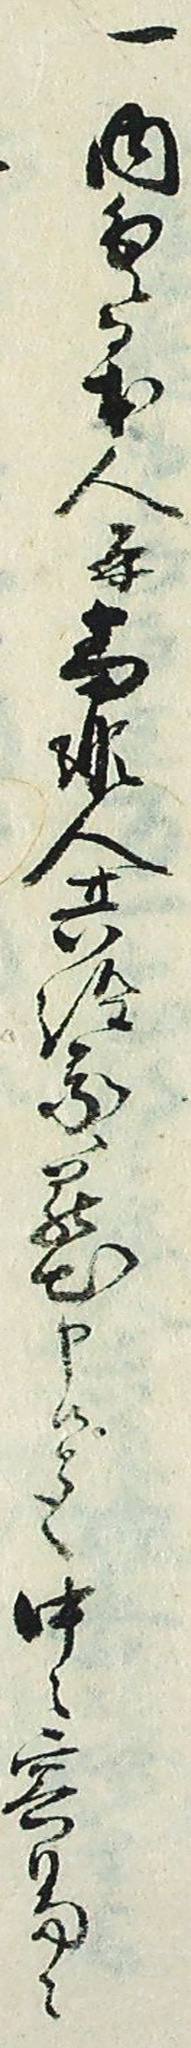一内分ニ而本人幷番非人共詮義へ罷出申候とも中々容易之
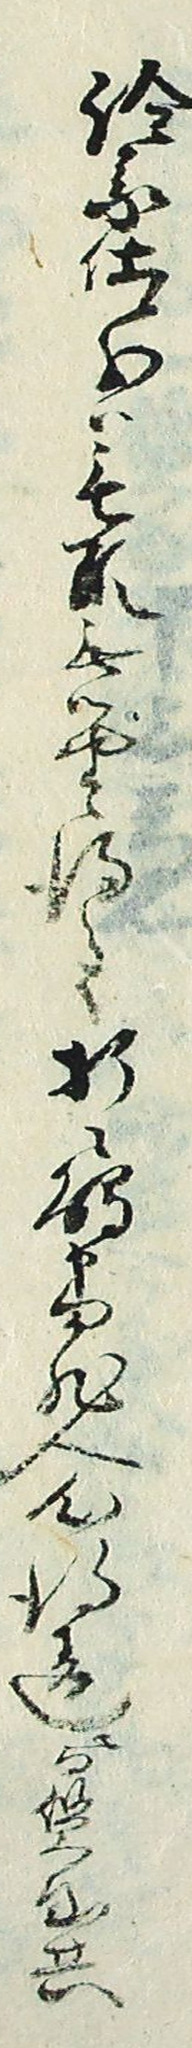詮義仕候義ハ毛頭無御坐候得とも折ニ觸番非人心得違ニ而質屋共
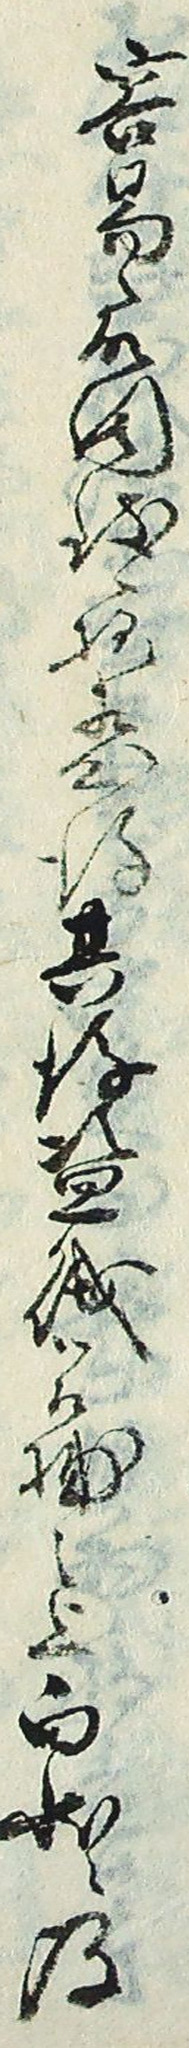容易之取調致候様相心得其後盗賊ハ召捕之上白状ニ及
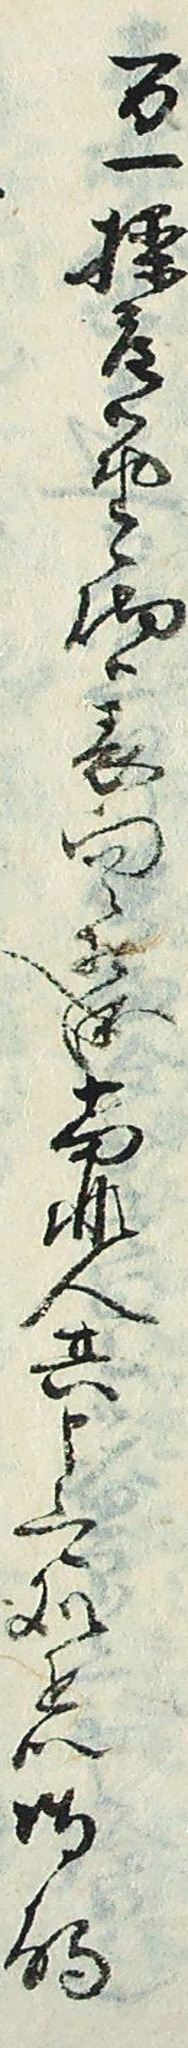万一操落御坐候砌ハ表向ニ相成番非人共申上候処を以御觸
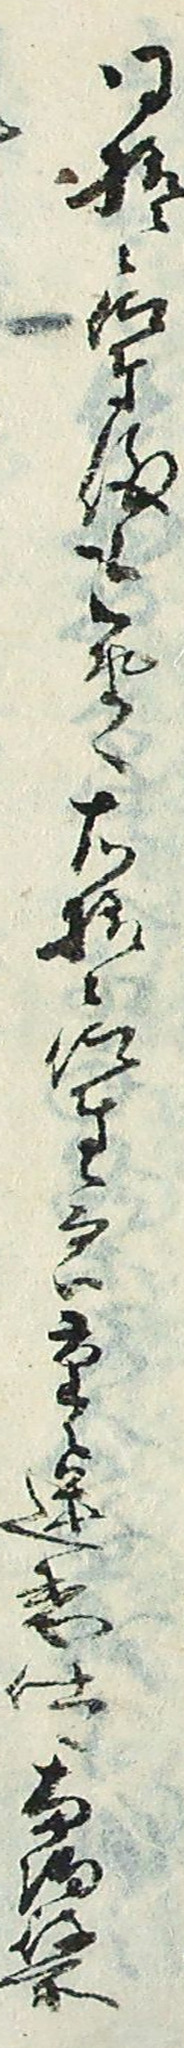同様ニ被仰付儀も御坐候右様被仰付候而ハ重々迷惑仕候番御役所
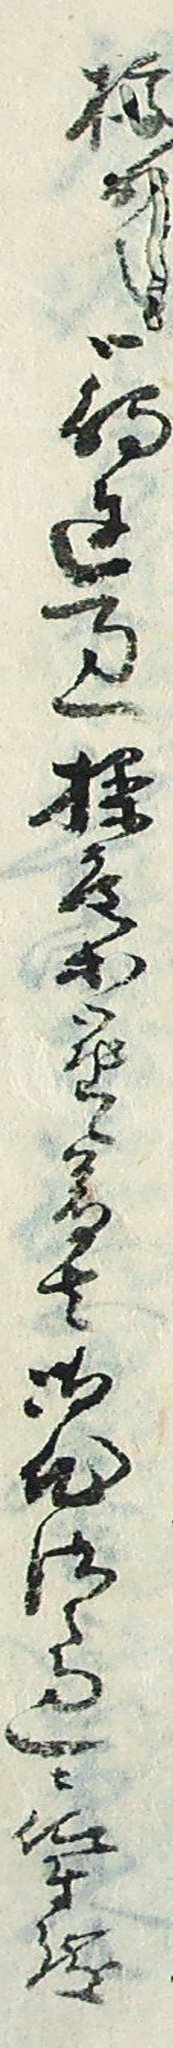様ゟ之御觸達万一操落等御坐候節者御作法之通被仰付度

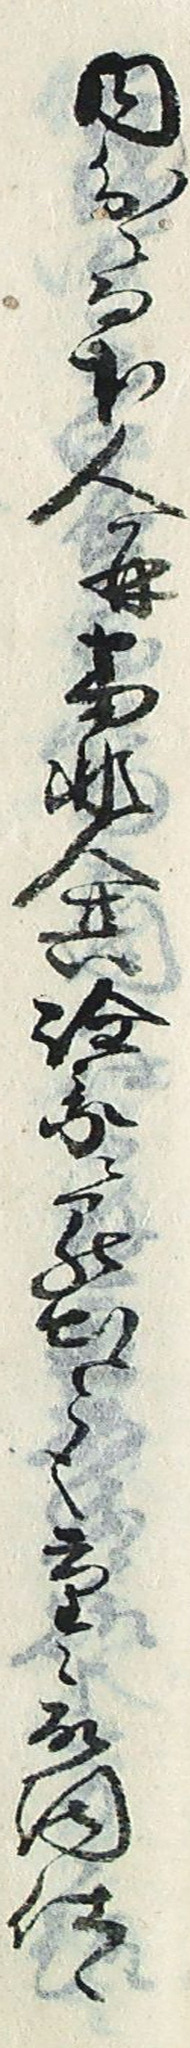内分ニ而本人幷番非人共詮義ニ罷出候とも重々取調仕候
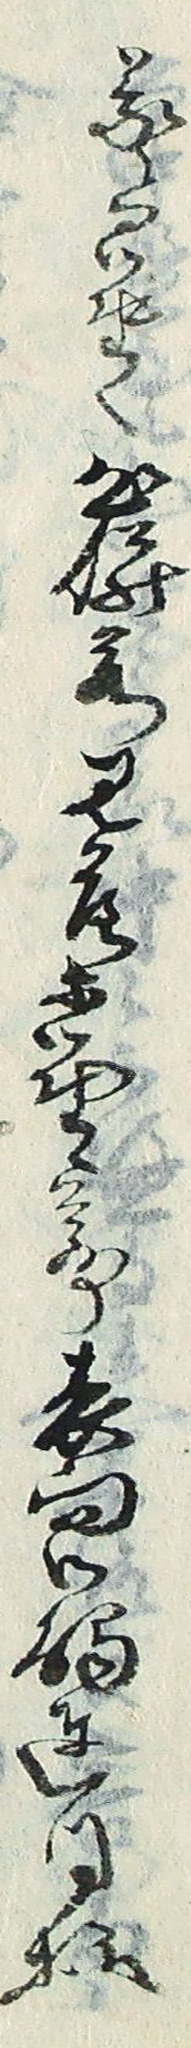義ニ而御坐候乍併若見落等御坐候節表向御觸達同様
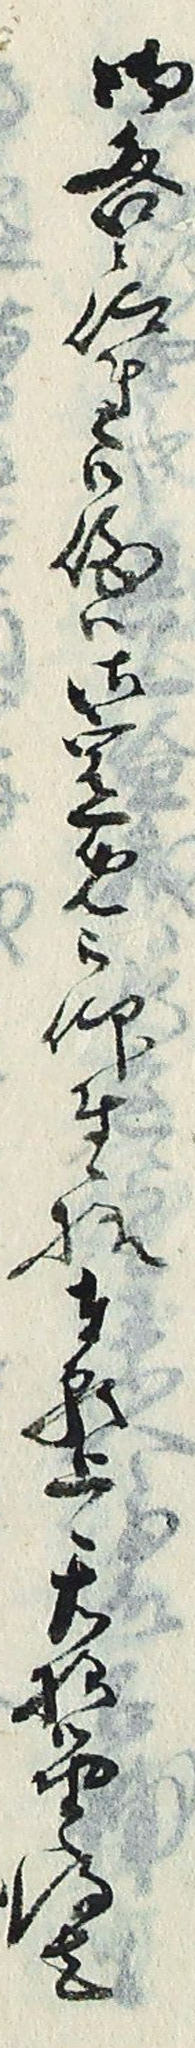御咎被仰付候御儀ハ御宥免被仰付候様奉願上候右様御坐候得者
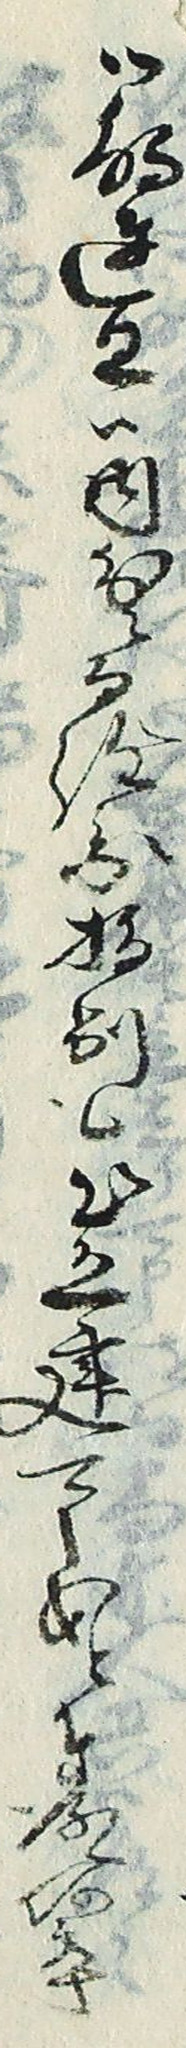御觸達且ハ内分ニ而詮義格別も乍恐建可申義と奉存候何卒
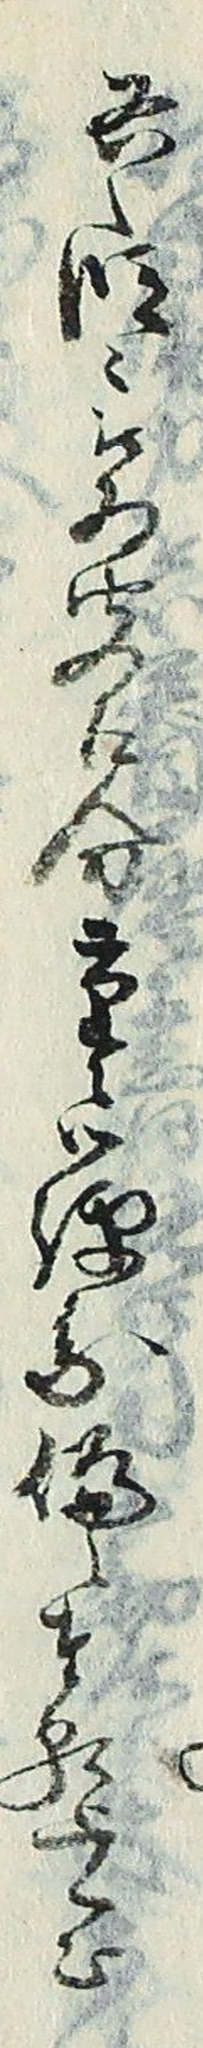右之段々被為聞召分重々御評義偏ニ奉願上候以上
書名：市郷質屋株御取究並御書出御趣法之写
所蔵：鳴門教育大学 Naruto University of Education
